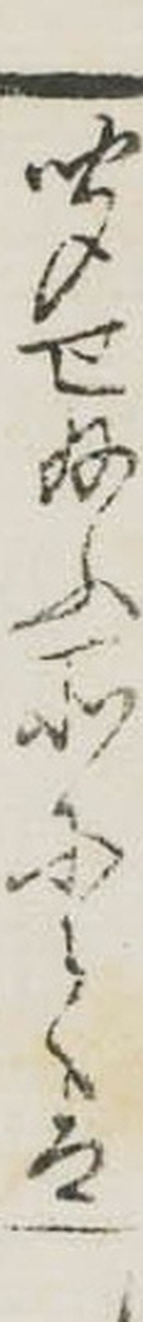聞せ給ふ所にては
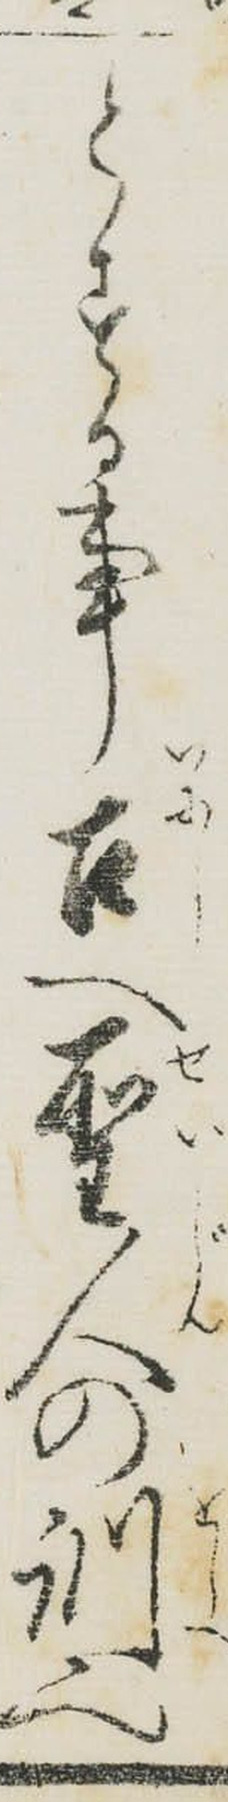とする事古へ聖人の訓也
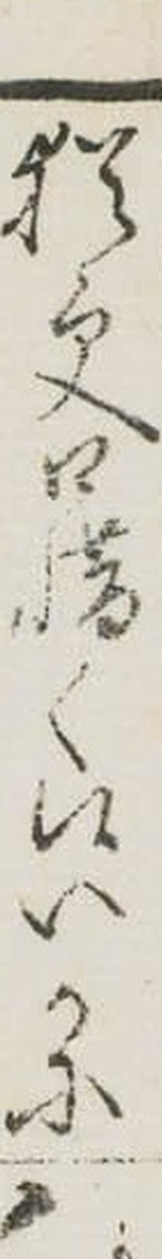猶更口惜く候いかに
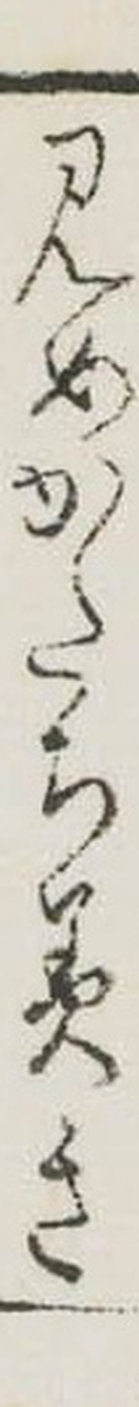みめかたち美き
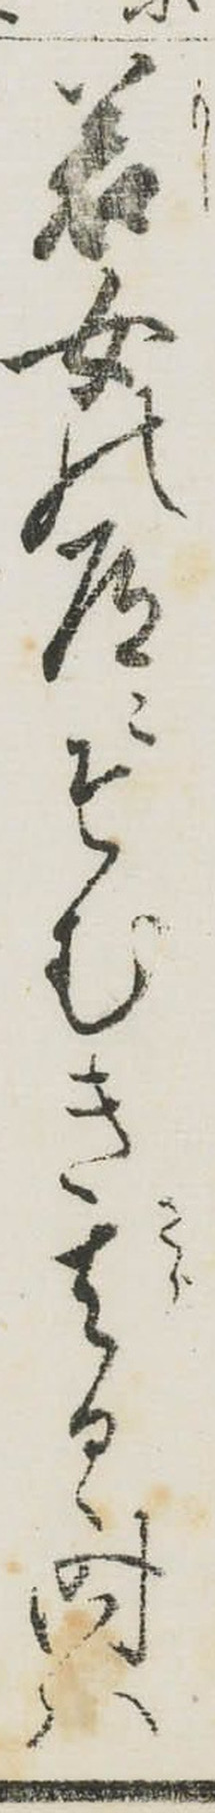若女の道去るゝ時は
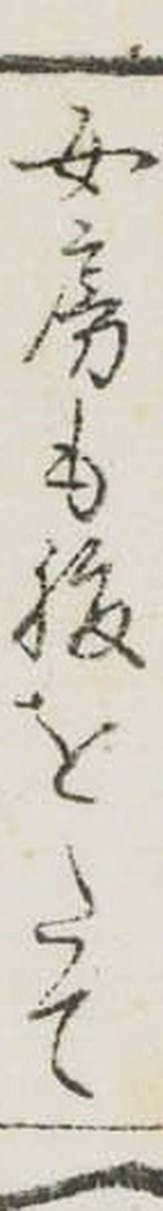女房も腹をたて
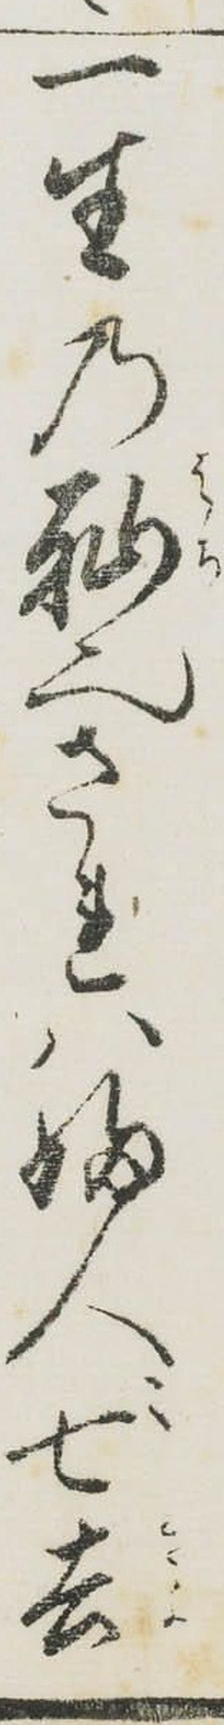一生の恥也されは婦人七去
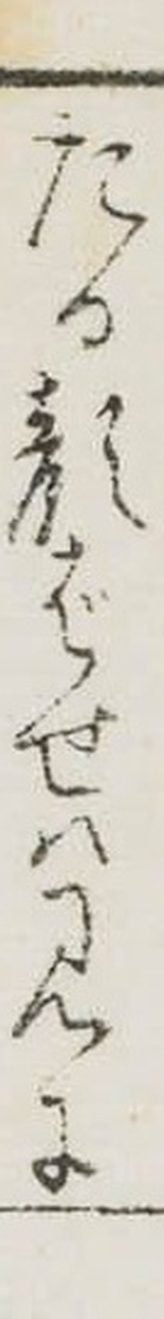たる顔ばせはみに
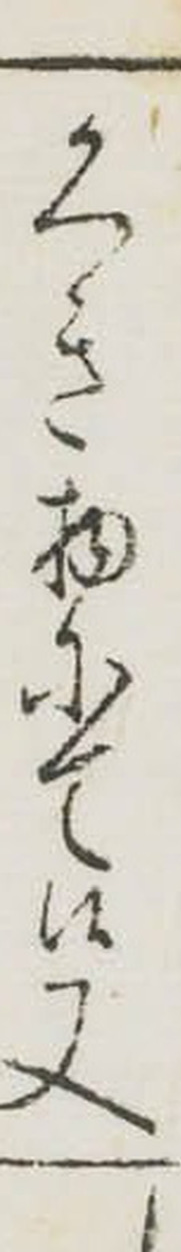くき物にて候又
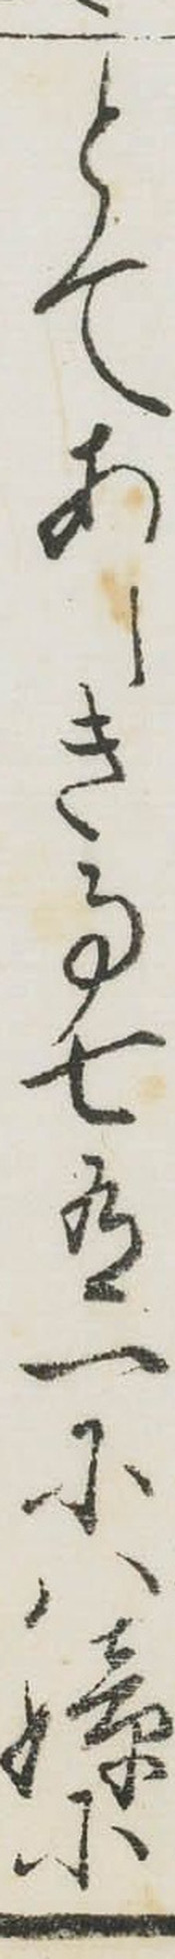とてあしき事七有一には嫜に
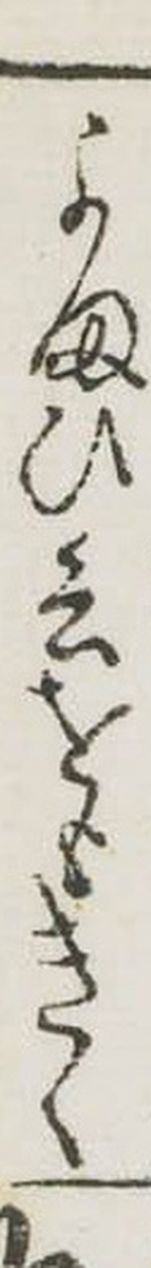よまひ言をもきく
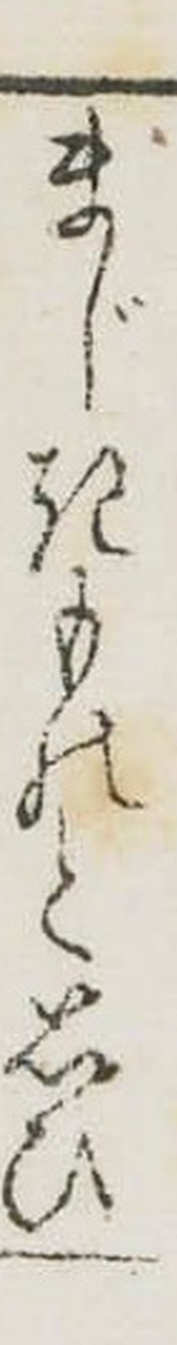まじきものと思ひ
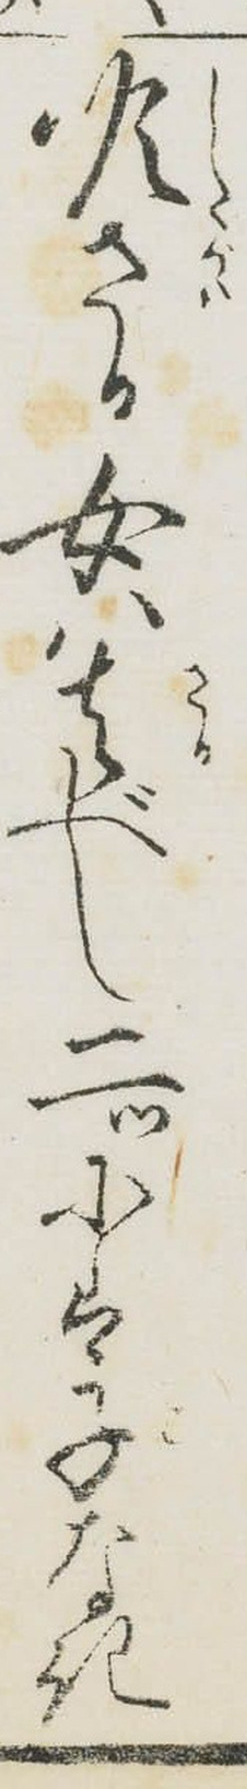順さる女は去べし二ッには子なき
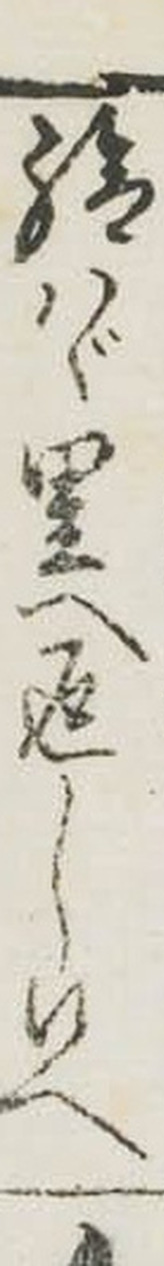給はゞ里へ返し候へ
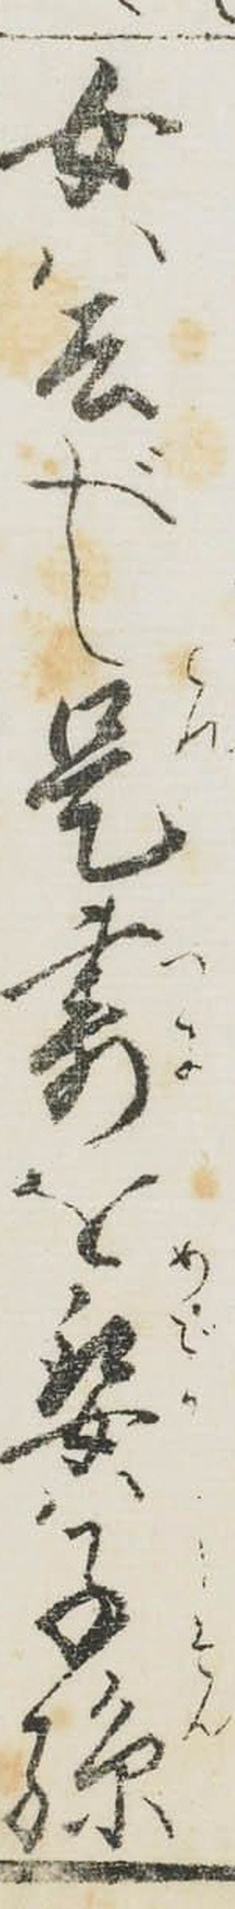女は去べし是妻を娶は子孫
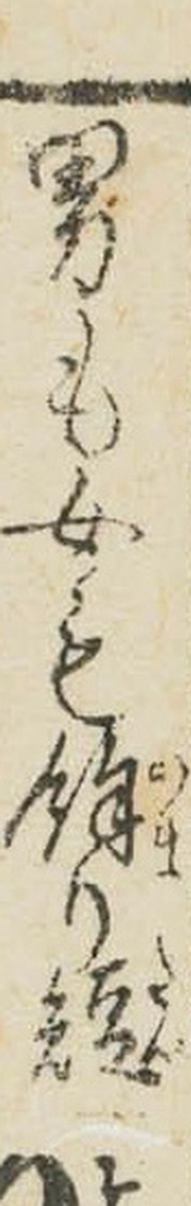男も女も余り短
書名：女大学
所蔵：東京学芸大学教育コンテンツアーカイブ
